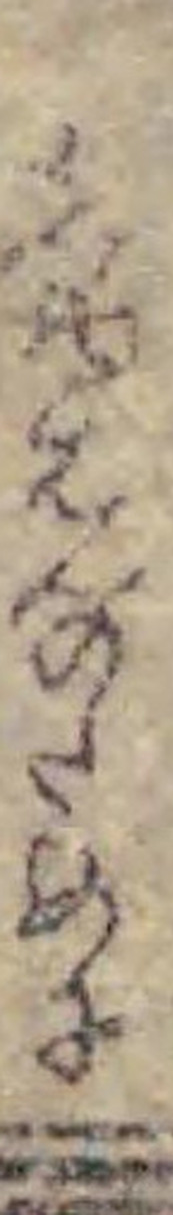しゆはんのために
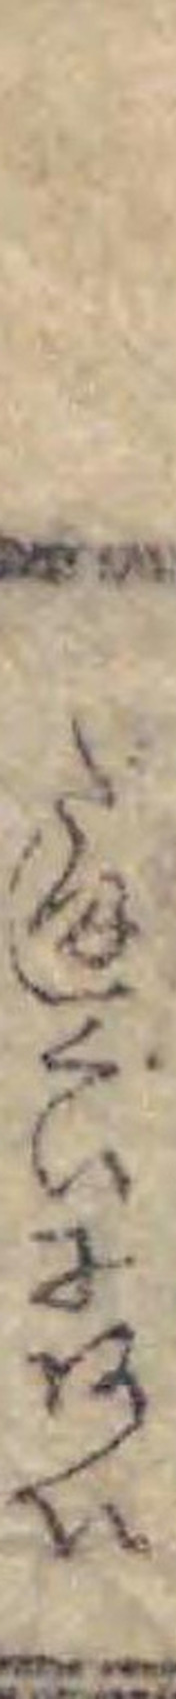だましくいにあい
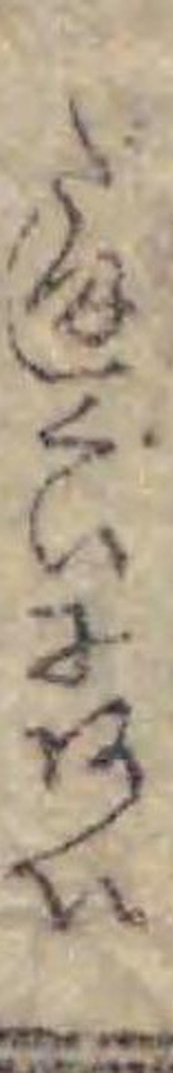だましくいにあい
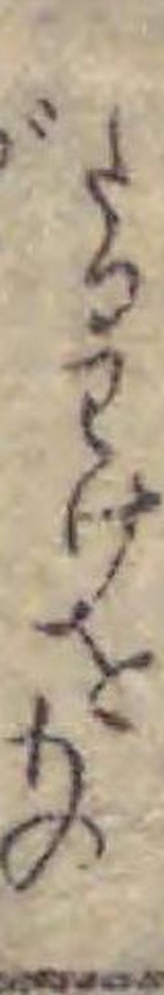たるわけをもの
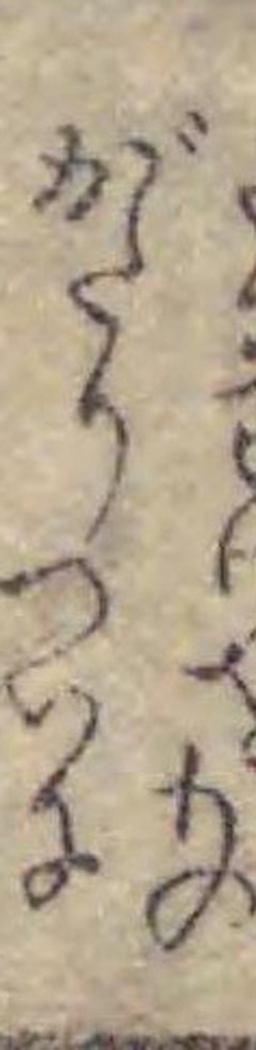がたりついに
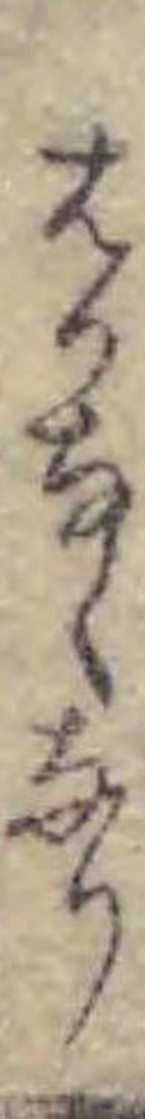はかなくなり
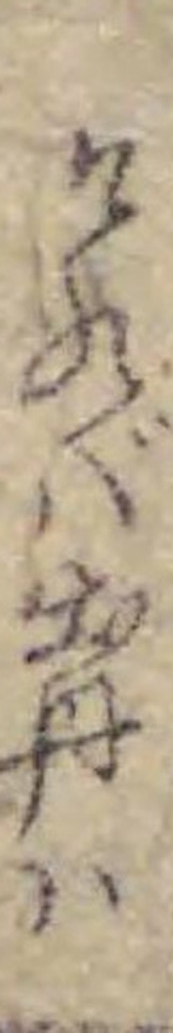ければ出丹は
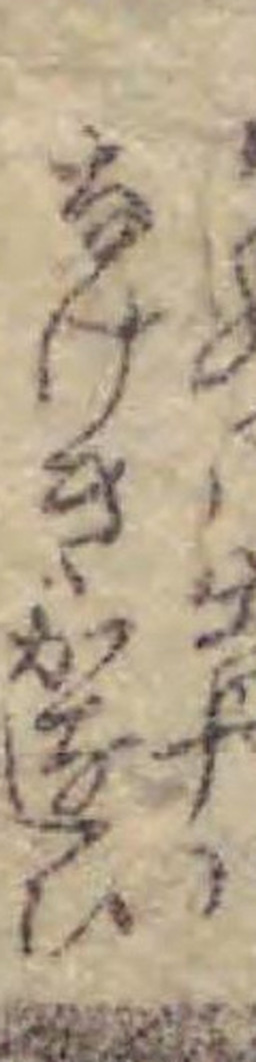なけきかなしひ
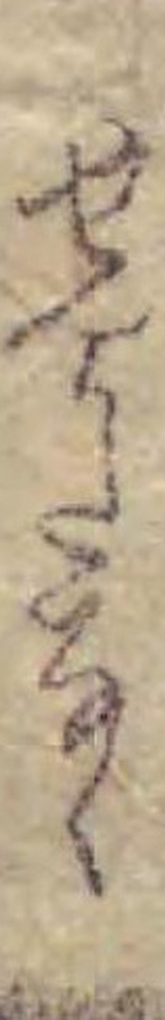せんかたなく
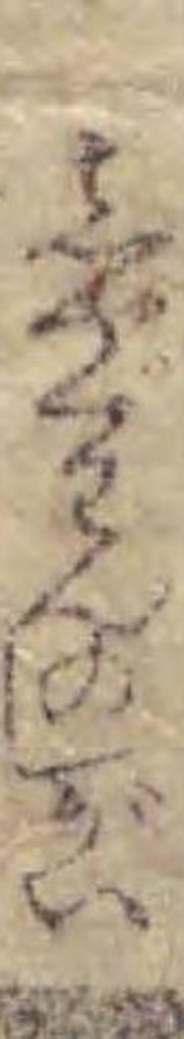しやくわんのしがい
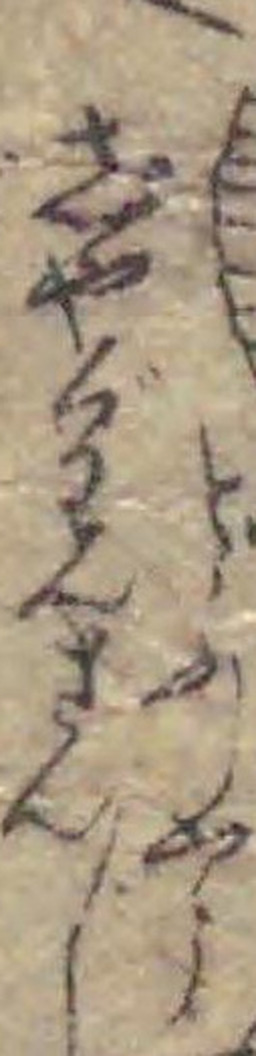じやぐわんさん〳〵
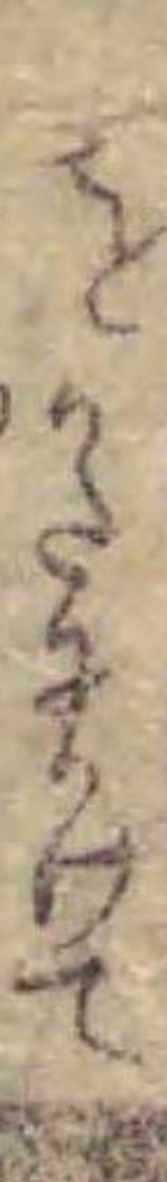をかたにかけて
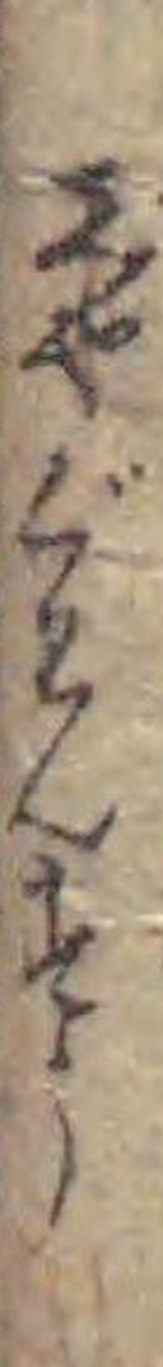じやぐわんすう
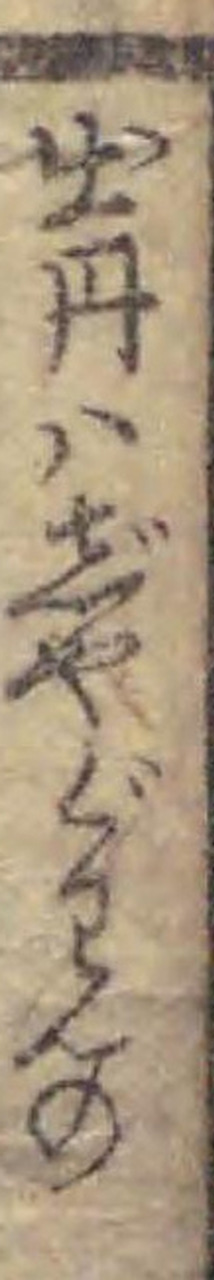出丹はじやぐわんの
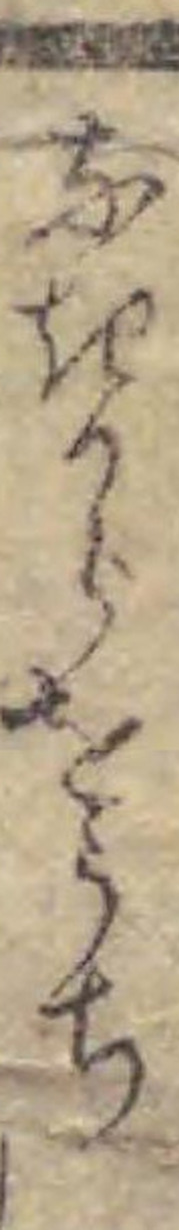なきからをうち
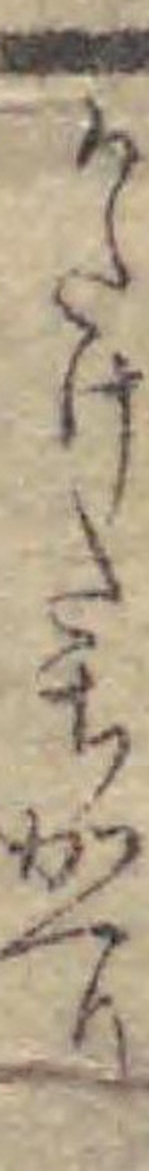かたげたちかへり
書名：化物世界夜半嵐 : 3巻
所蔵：国立国会図書館 National Diet Library, JAPAN
